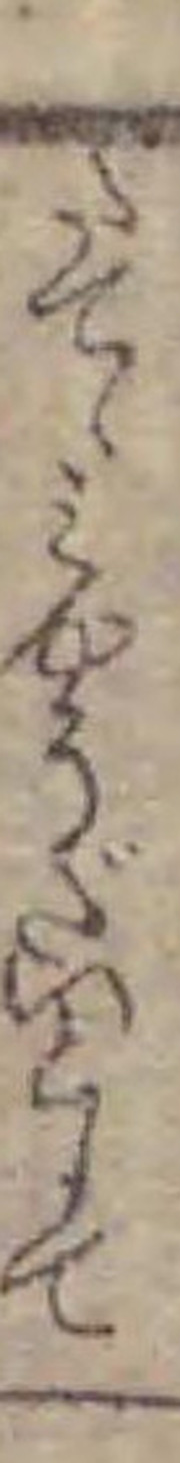たてゝみやうだいとして
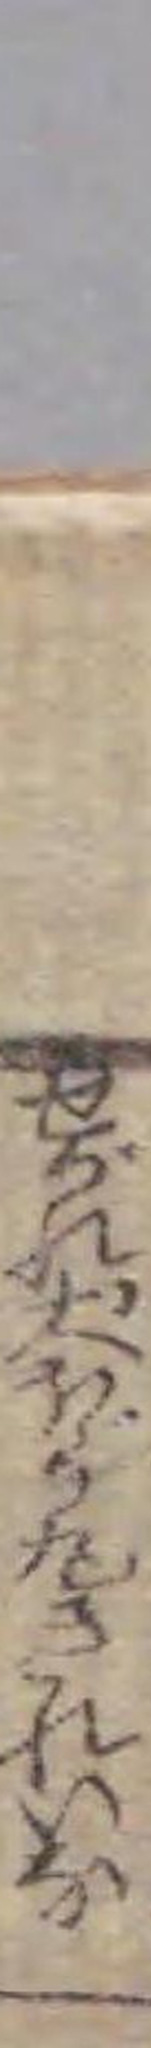せがれ犬ぼう丸きれいな
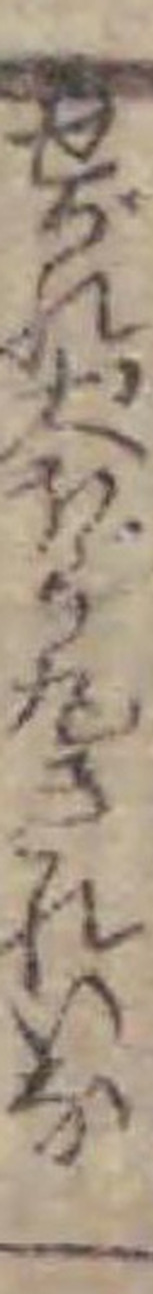せがれ犬ぼう丸きれいな
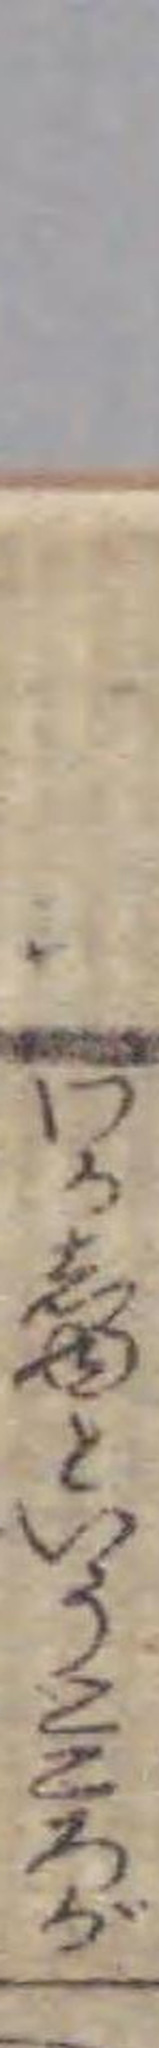わかしゆというところが
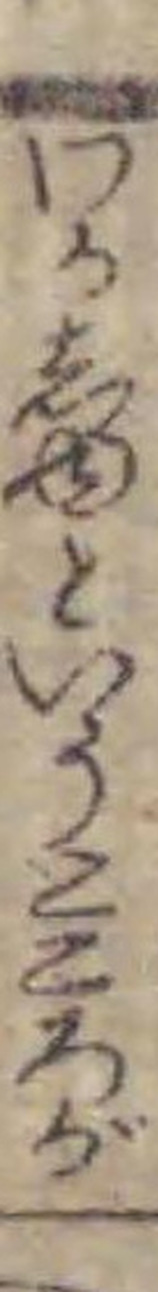わかしゆというところが
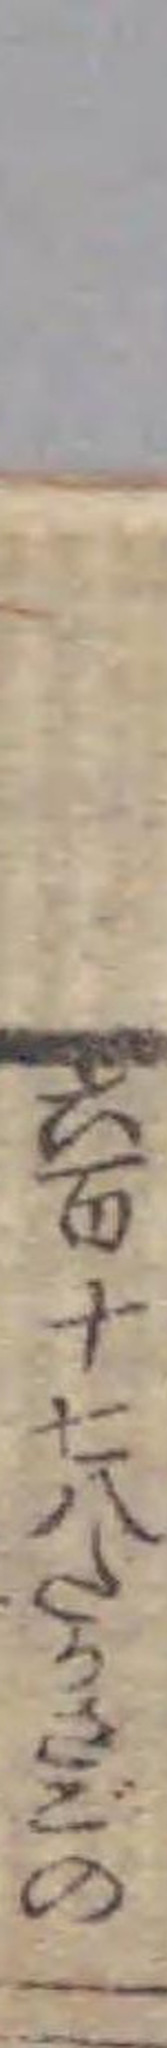六百十七八たかさごの
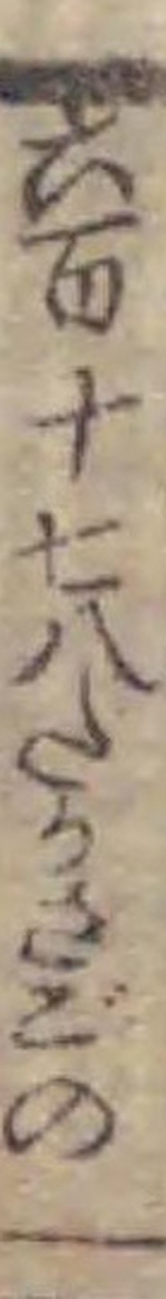六百十七八たかさごの
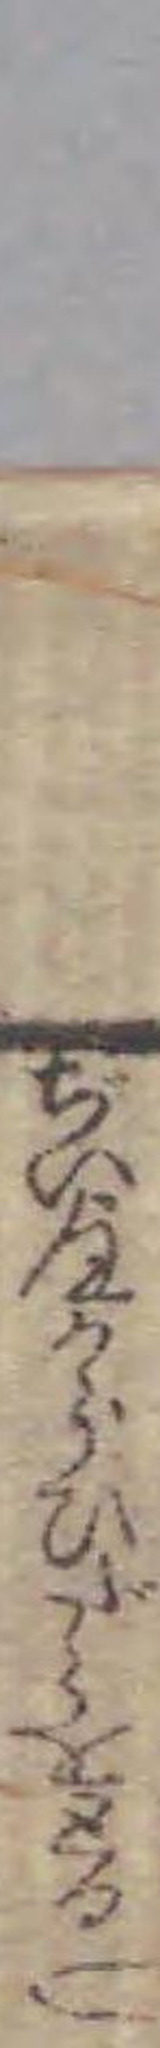ぢさまからひだらをとる
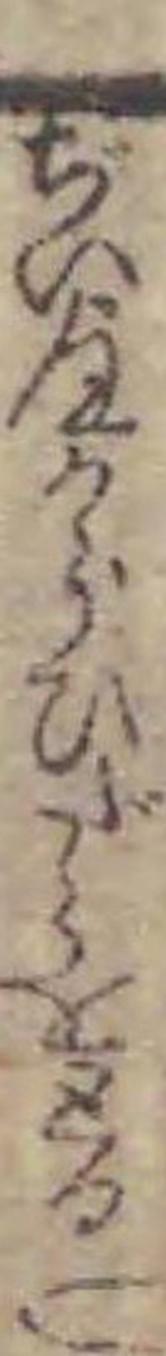ぢさまからひだらをとる
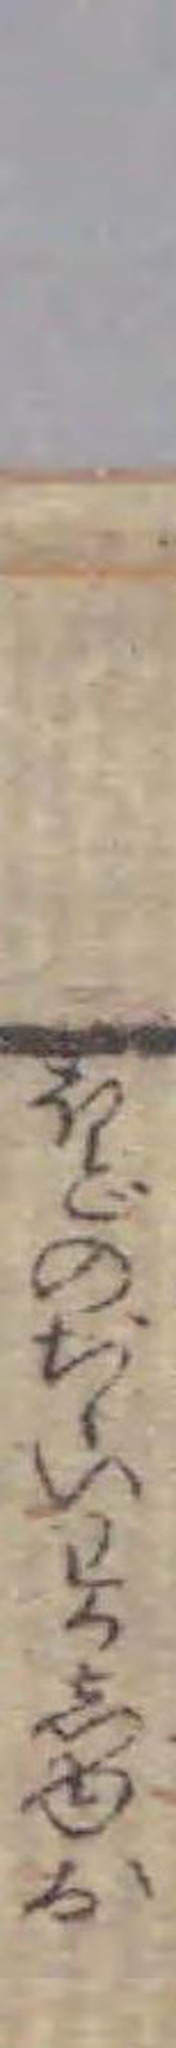ほどのぢゝいわかしゆお
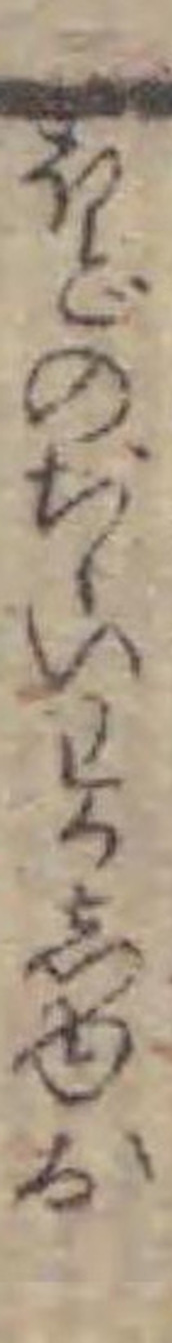ほどのぢゝいわかしゆお
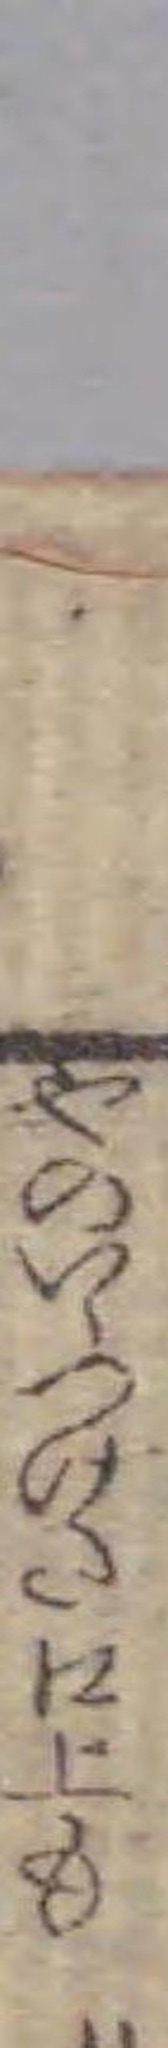やのいゝつけた口上も
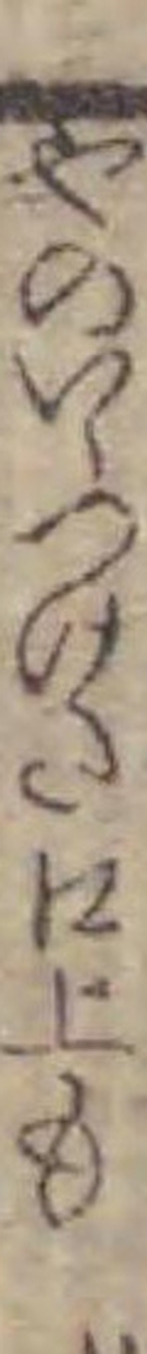やのいゝつけた口上も
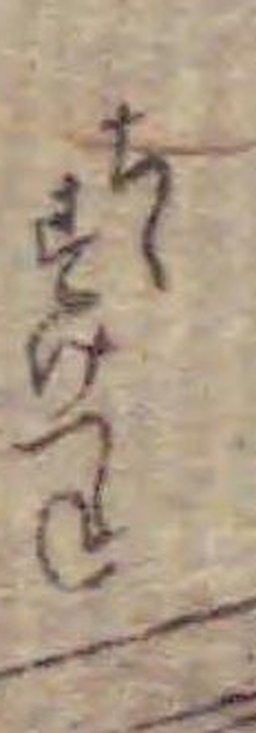すけつね
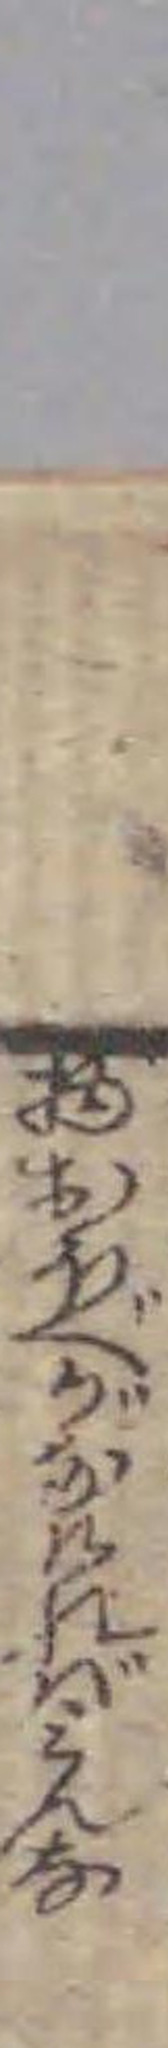物おぼへがなければみんな
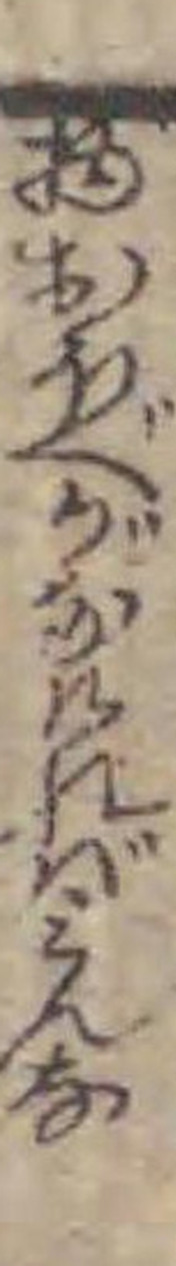物おぼへがなければみんな
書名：年寄之冷水曽我 : 3巻
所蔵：国立国会図書館 National Diet Library, JAPAN
